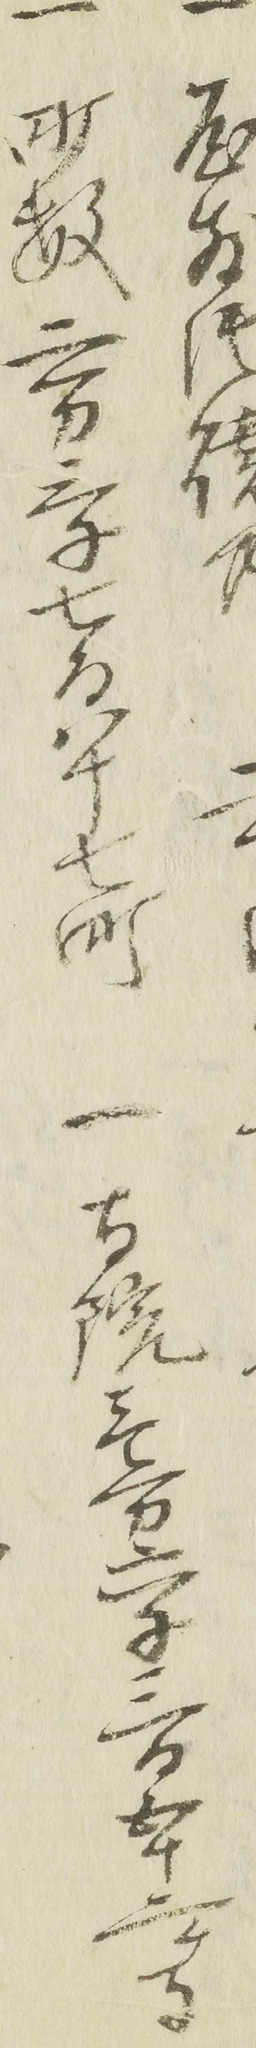一町数二万三千七百八十七町一寺院壱万六千三百五十二ケ寺
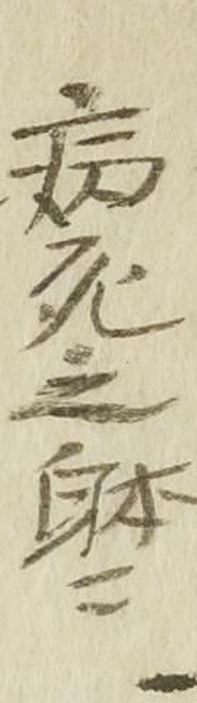病死之躰ニ
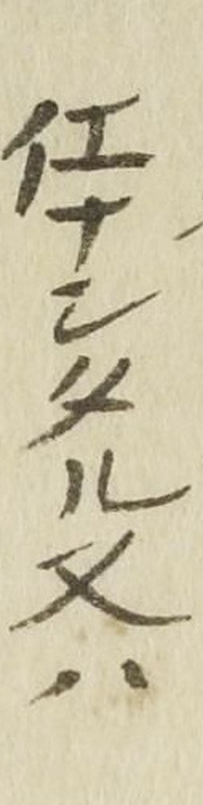ナシタル又ハ
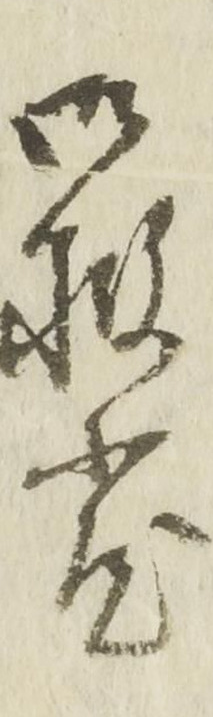御救小屋
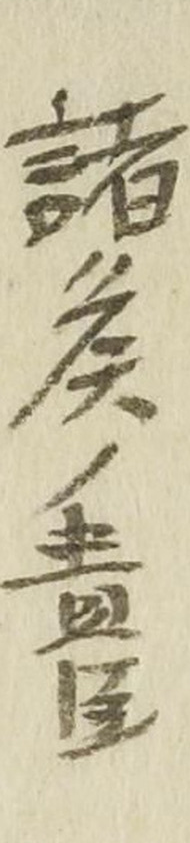諸侯ノ貴臣
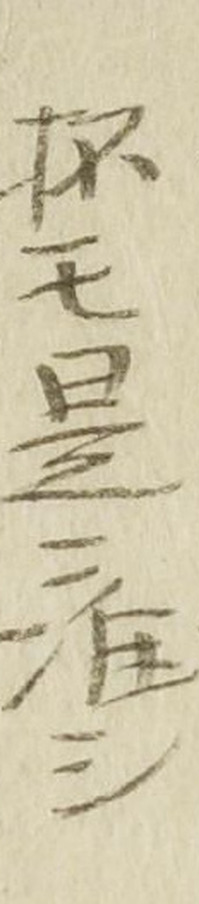抔モ是ニ准シ
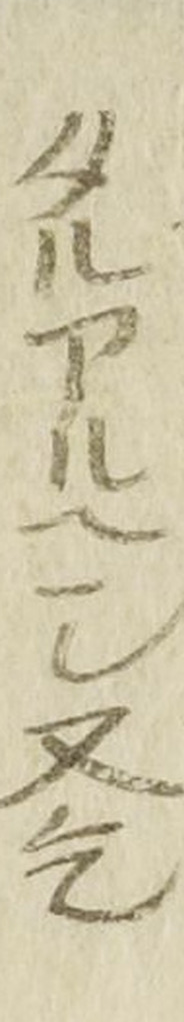タルアルヘシ又乞
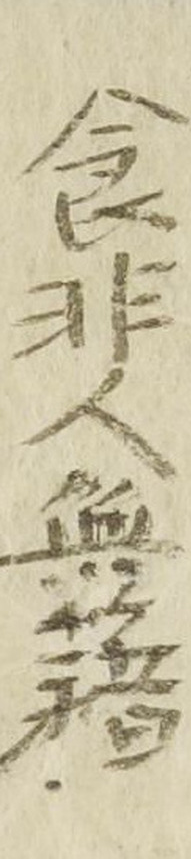食非人無籍
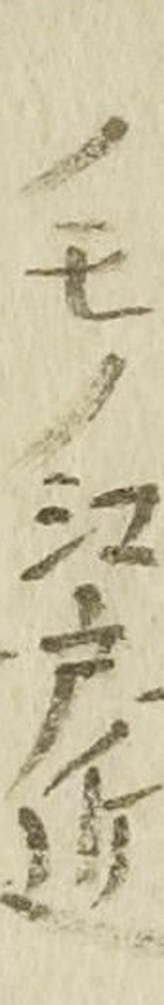ノモノ江戸近
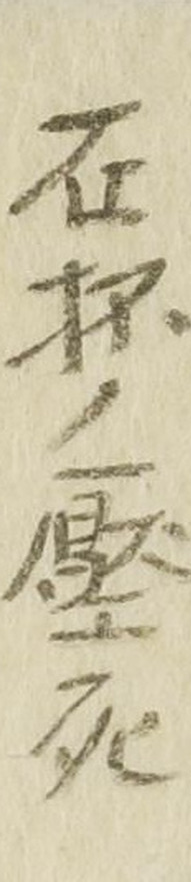在抔ノ圧死
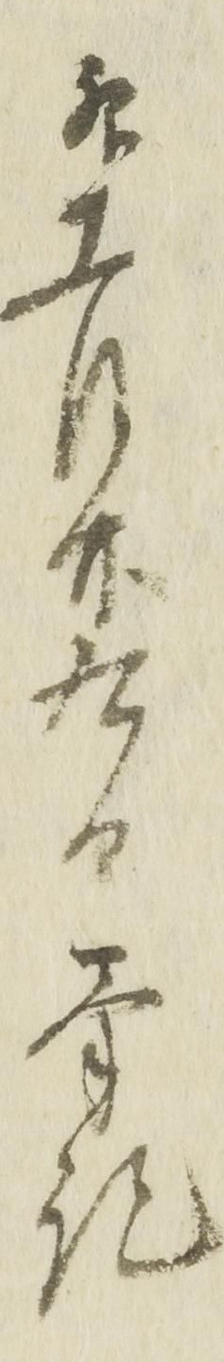卯十一月廿九日筆記
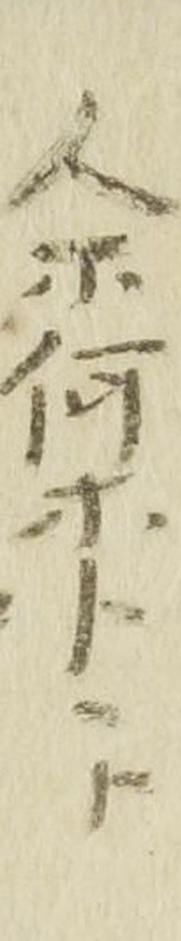人等何ホトヽト
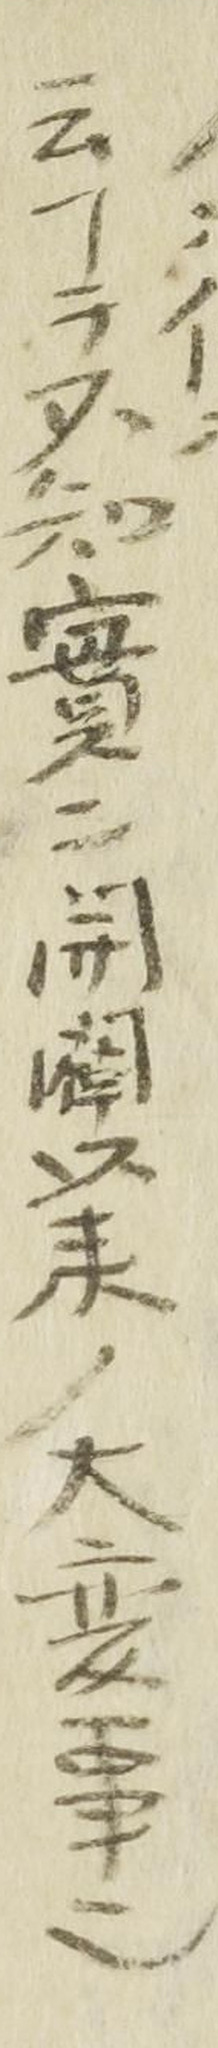云フテ不知實ニ開闢以来ノ大変事也
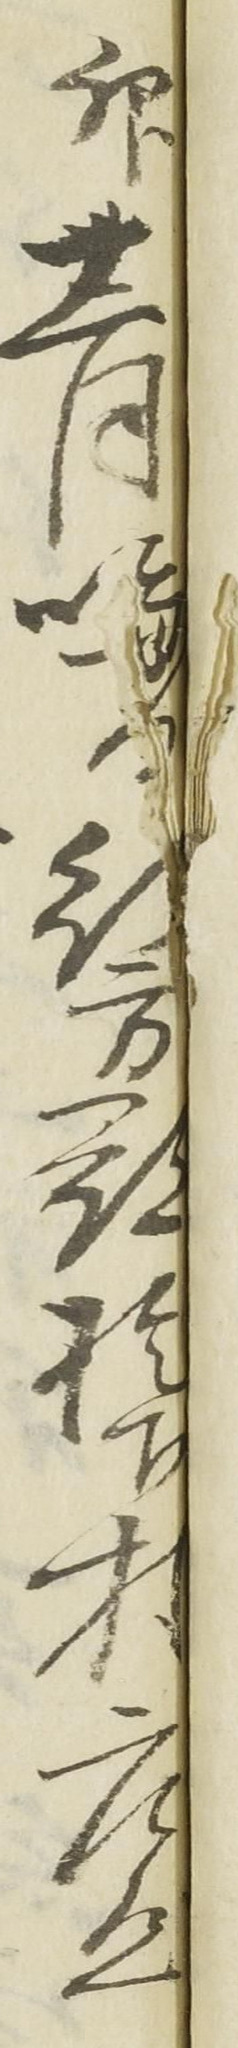卯十一月晦日行方郡拾か村庄屋
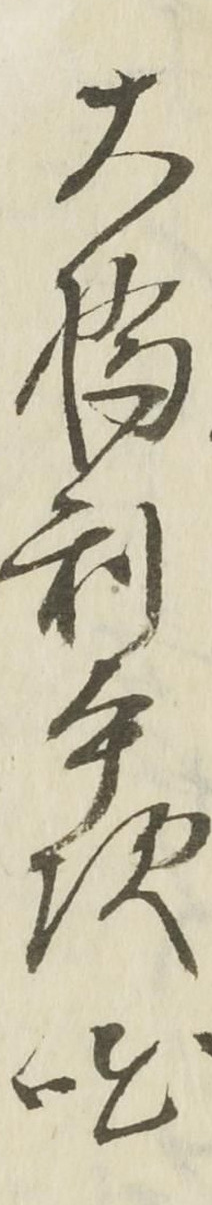大橋利平次咄
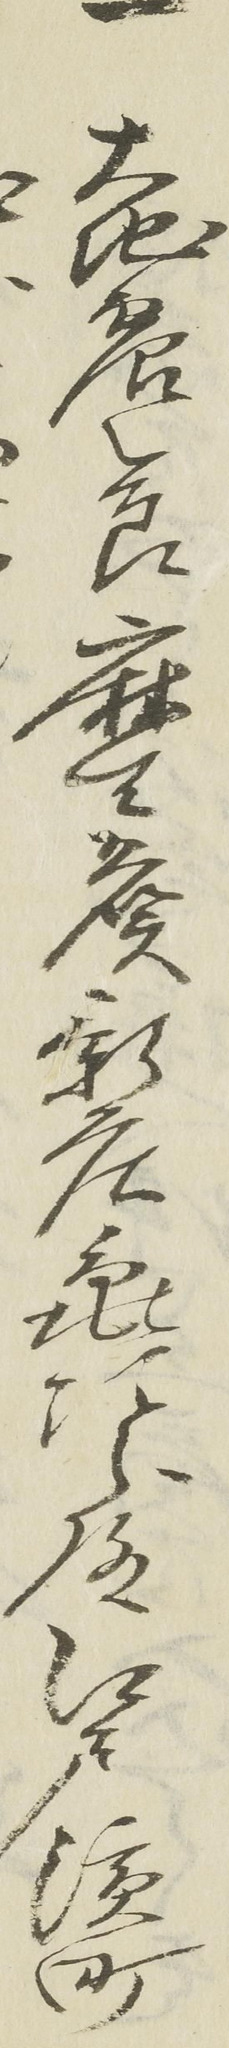一大地震之節麻生侯新庄亀次郎殿江戸濱町
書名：安政乙卯江戸大地震筆記　安政丙辰八月大阪大雷雨之記追加　安政三辰年七月松前辺大地震并八月大風雨記録
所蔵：東京大学地震研究所図書室 Earthquake Research Institute Library, The University of Tokyo, JAPAN
